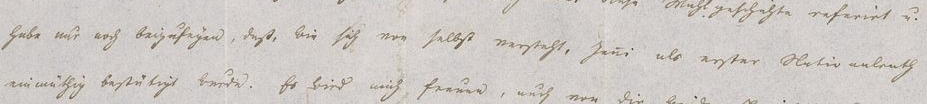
habe nur noch beizufügen, daß, wie sich von selbst versteht, Jenni als erster Nationalrath
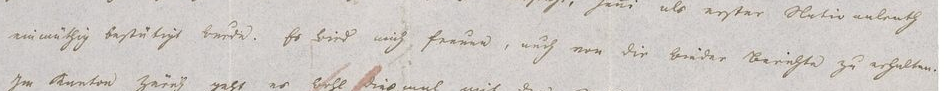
einmüthig bestätigt wurde. Es wird mich freuen, auch von Dir wieder Berichte zu erhalten.
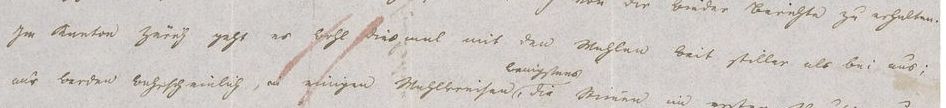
Im Kanton Zürich geht es wohl diesmal mit den Wahlen weit stiller als bei uns;
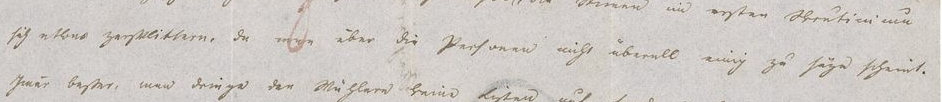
sich etwas zersplittern, da man über die Personen nicht überall einig zu seyn scheint.
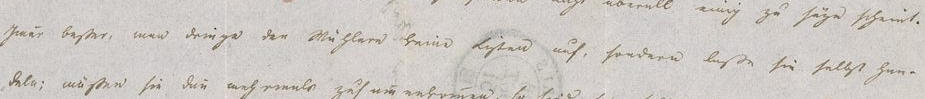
Immer besser, man dringe den Wählern keine Listen auf, sondern lasse sie selbst han-
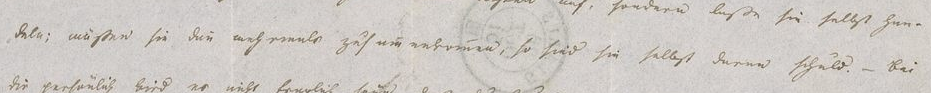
deln; müssen sie dann mehrmals zusammenkommen, so sind sie selbst daran schuld. – Bei
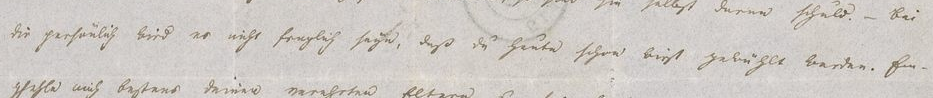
Dir persönlich wird es nicht fraglich seyn, daß Du heute schon wirst gewählt werden. Em-
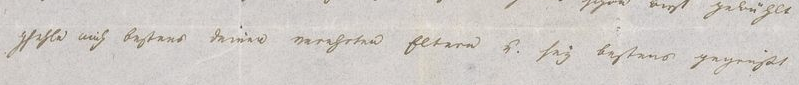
pfehle mich bestens Deinen verehrten Eltern u. sey bestens gegrüßt
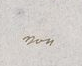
von
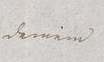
Deinem
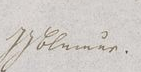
J J Blumer.
